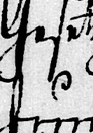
Es
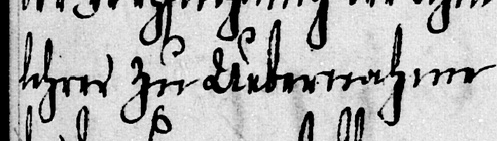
lehrer zu Uebernahme
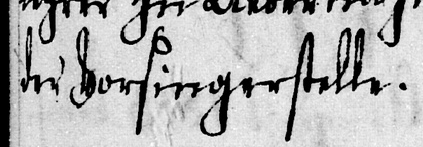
der Vorsingerstelle,
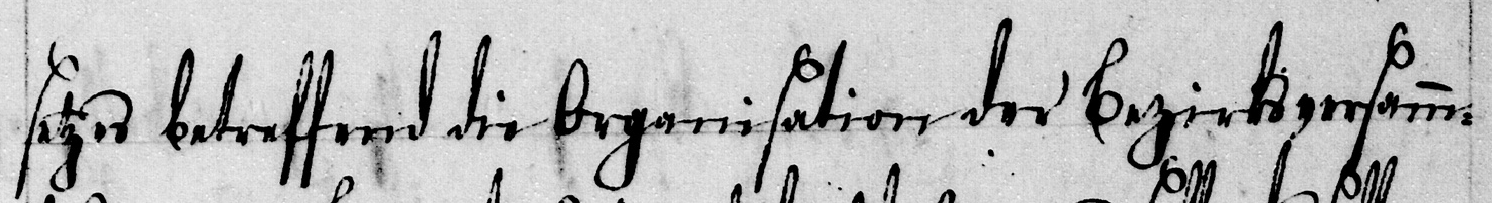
etzes betreffend die Organisation der Bezirksversam¬
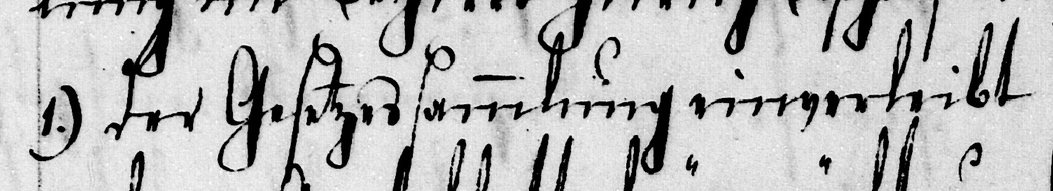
1.) Der Gesetzessammlung einverleibt
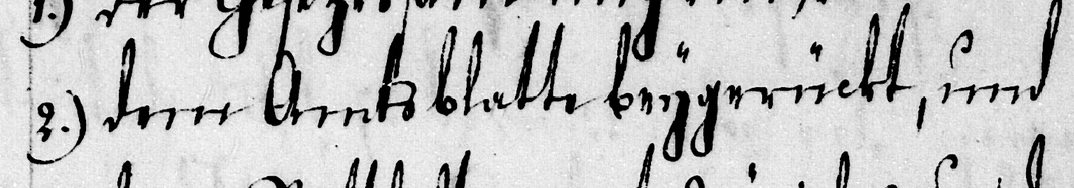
2.) dem Amtsblatte beygerückt, und:
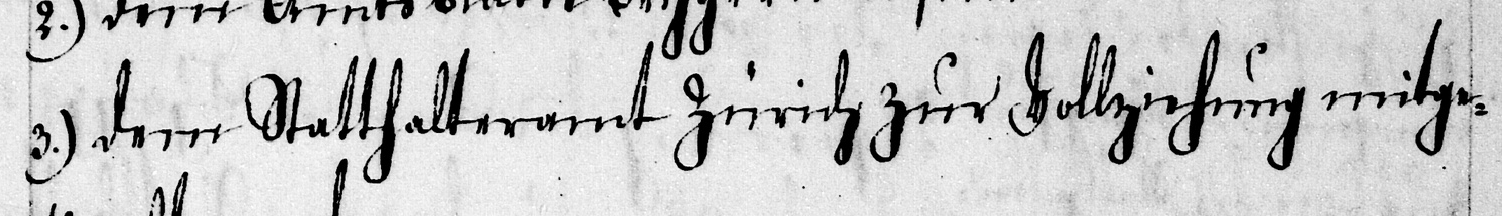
3.) dem Statthalteramt Zürich zur Vollziehung mitge¬
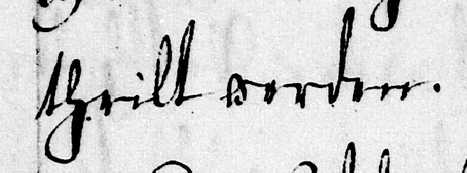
theilt werden.
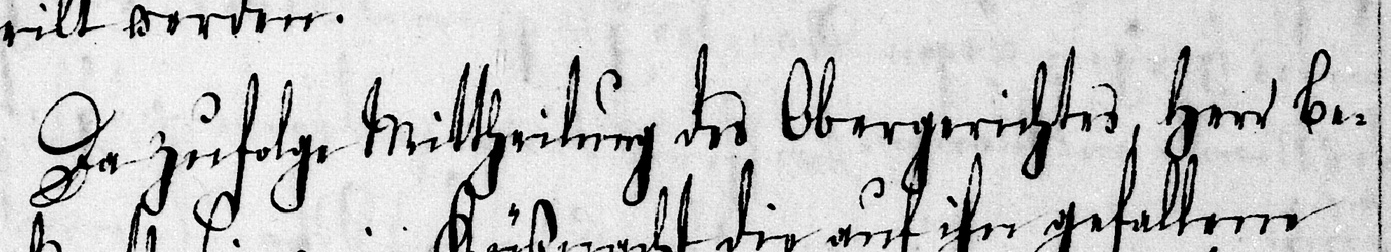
Da zufolge Mittheilung des Obergerichtes Herr Be¬
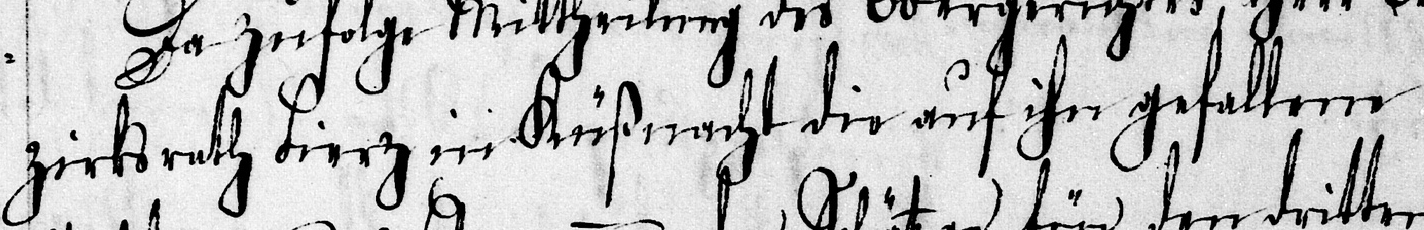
zirksrath Fierz in Küßnacht die auf ihn gefallene
